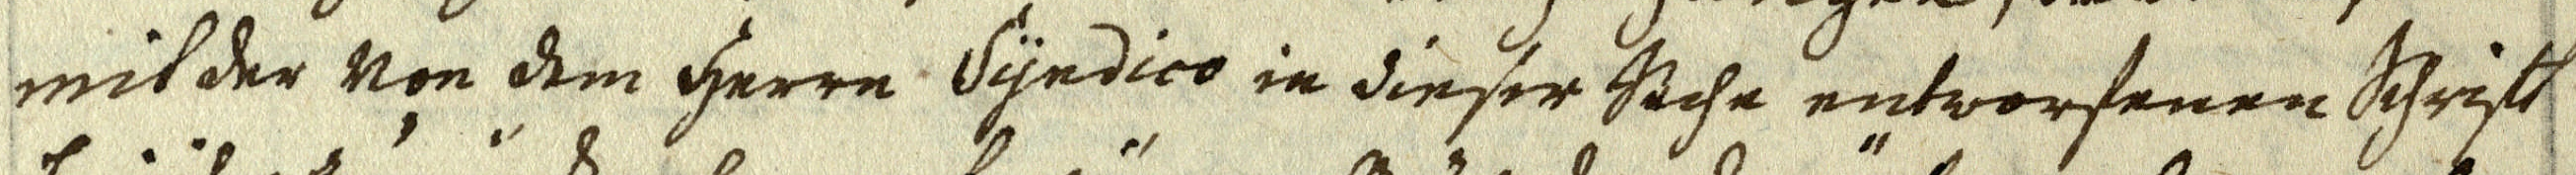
mit der von dem Herrn Sÿndico in dieser Sache entworfenen Schrift
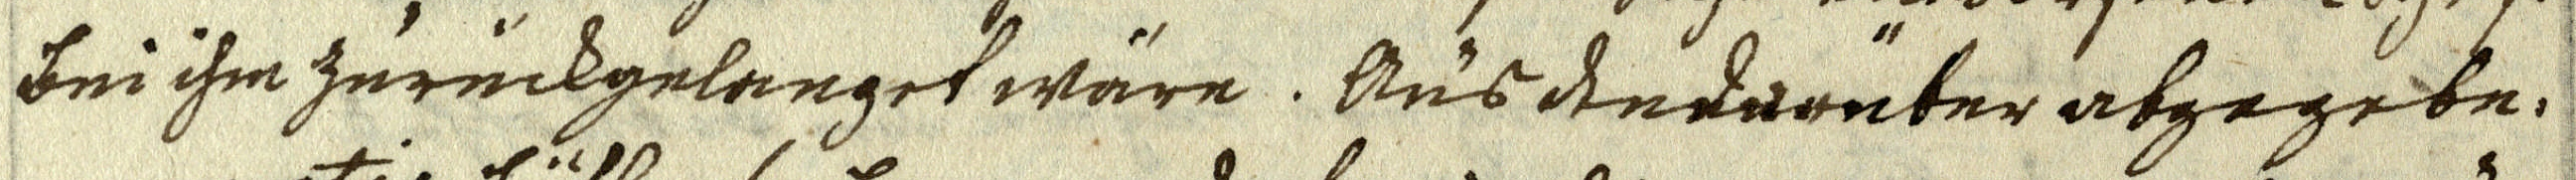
bei ihm zurückgelanget wäre. Aus den darüber abgegebe¬
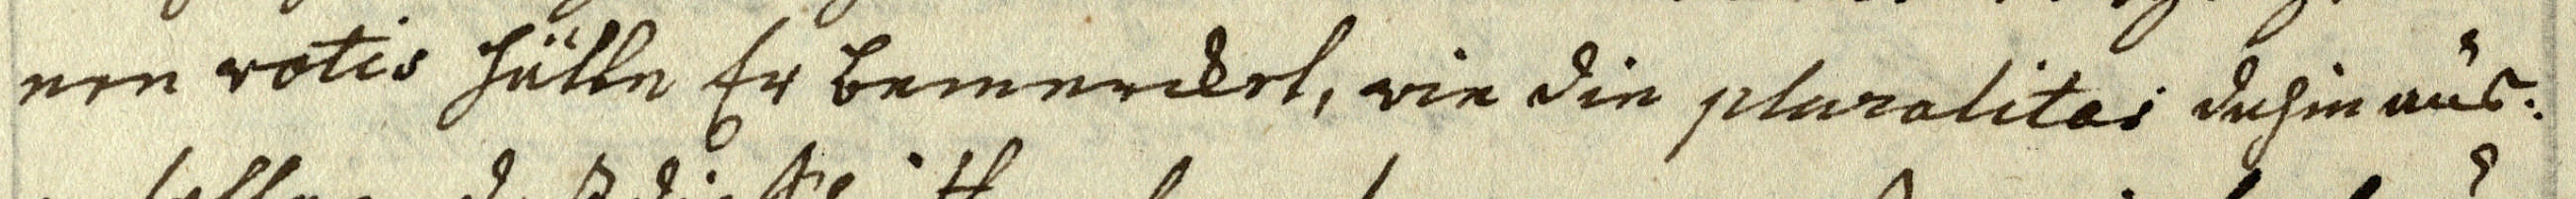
nen votis hätte Er bemercket, wie die pluralitas dahin aus¬
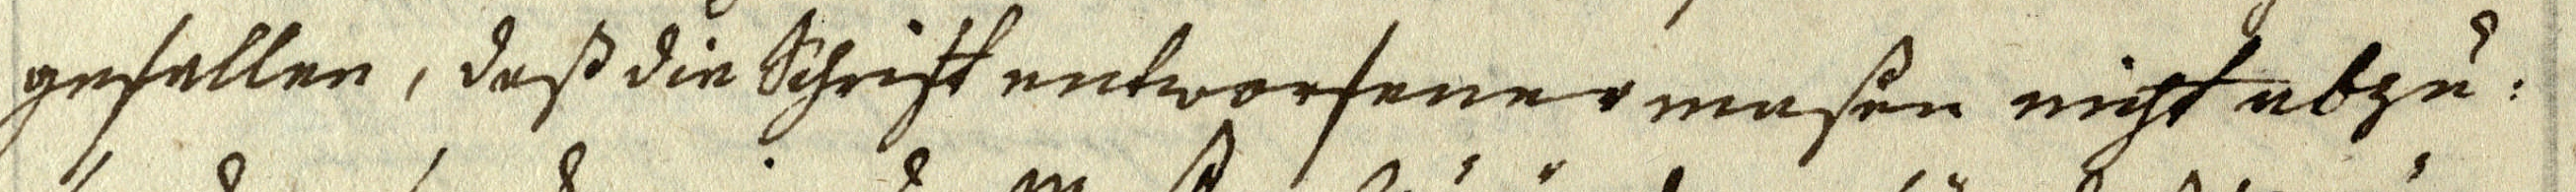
gefallen, daß die Schrift entworfenermaßen nicht abzu¬
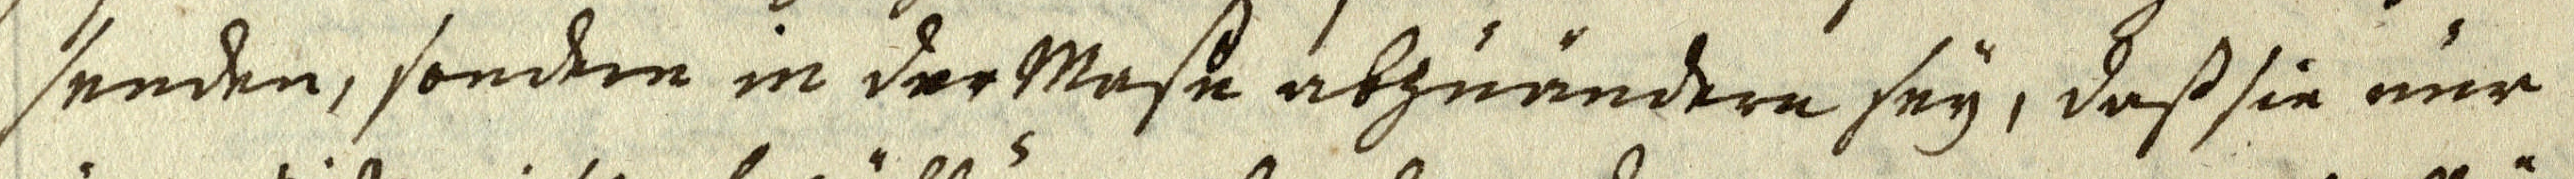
senden, sondern in der Maße abzuändern seÿ, daß sie nur
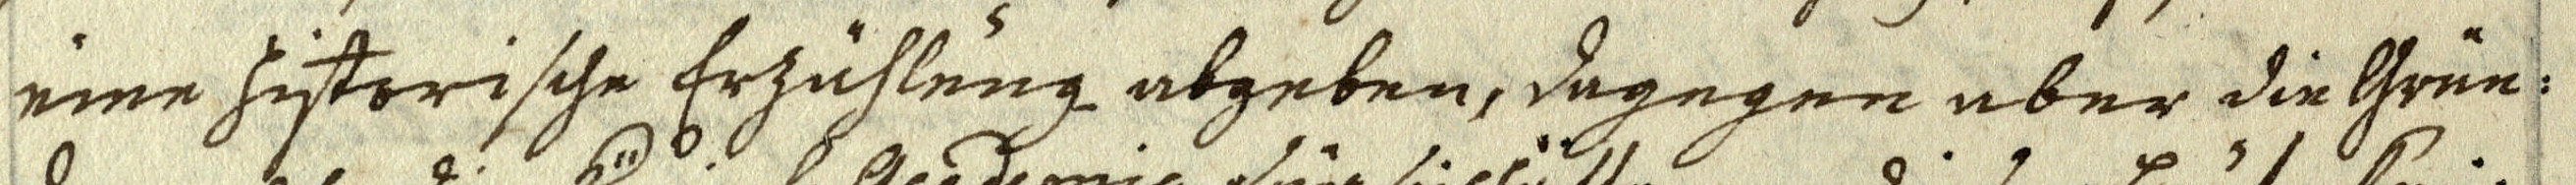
eine historische Erzählung abgeben, dagegen aber die Grün¬
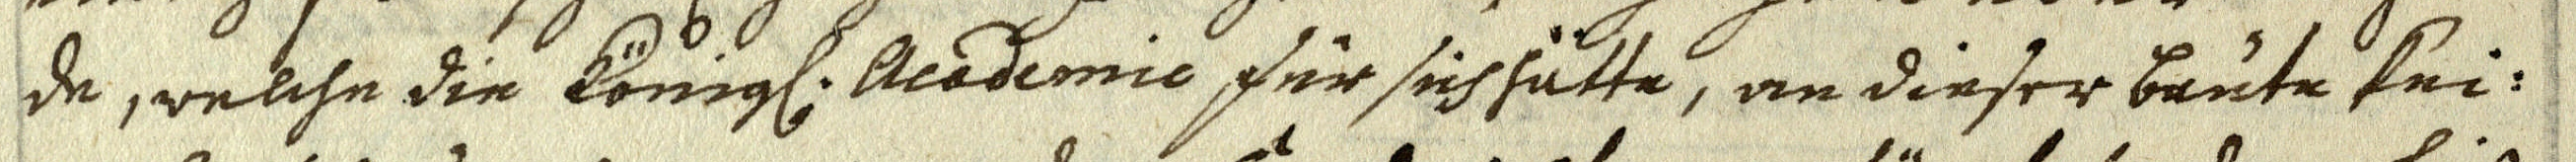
de, welche die Königl. Academie für sich hätte, an dieser Baute kei¬
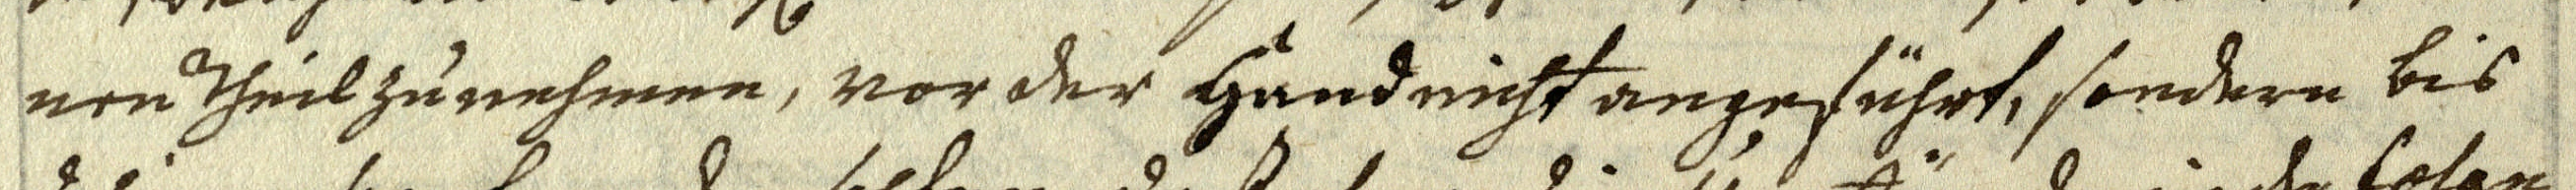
nen Theil zu nehmen, vor der Hand nicht angeführt, sondern bis
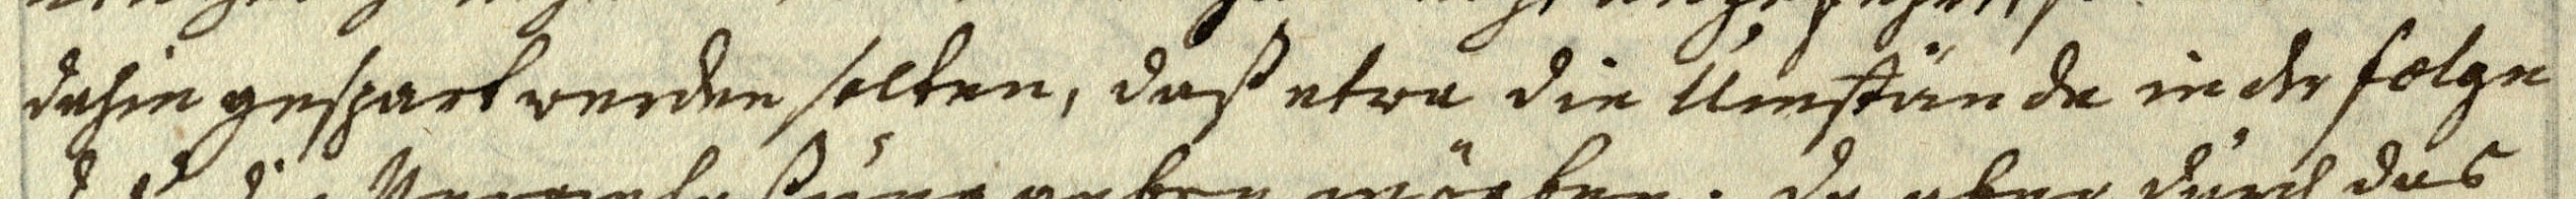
dahin gespart werden solten, daß etwa die Umstände in der Folge
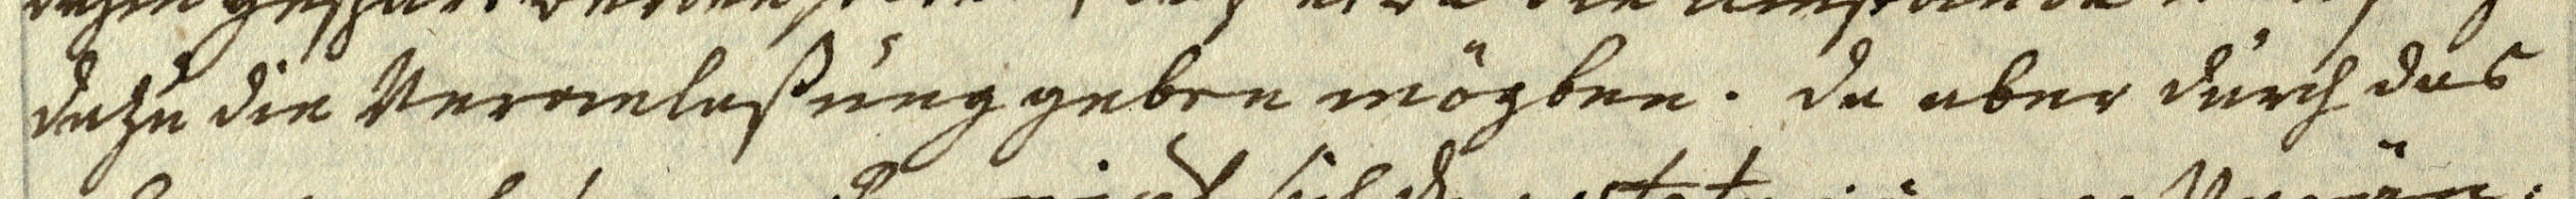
dazu die Veranlaßung geben mögten. Da aber durch das
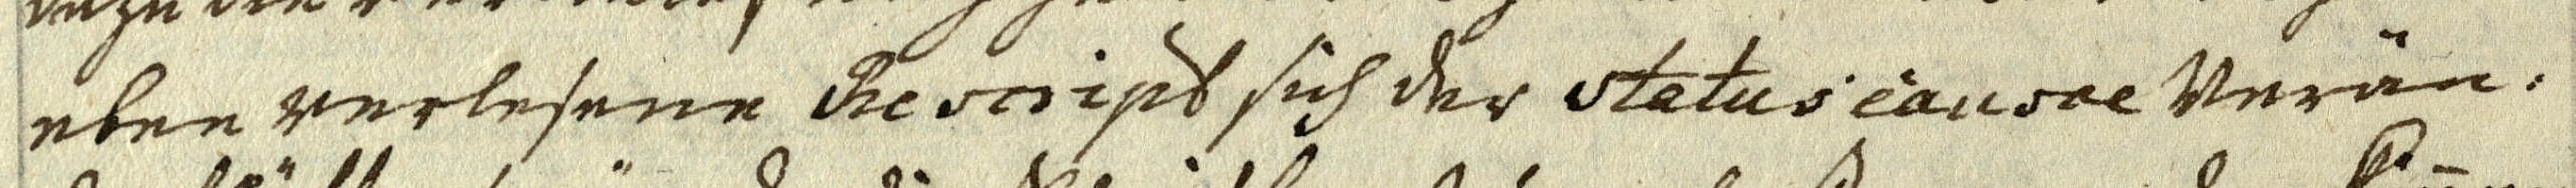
eben verlesene Rescript sich der status causae verän¬
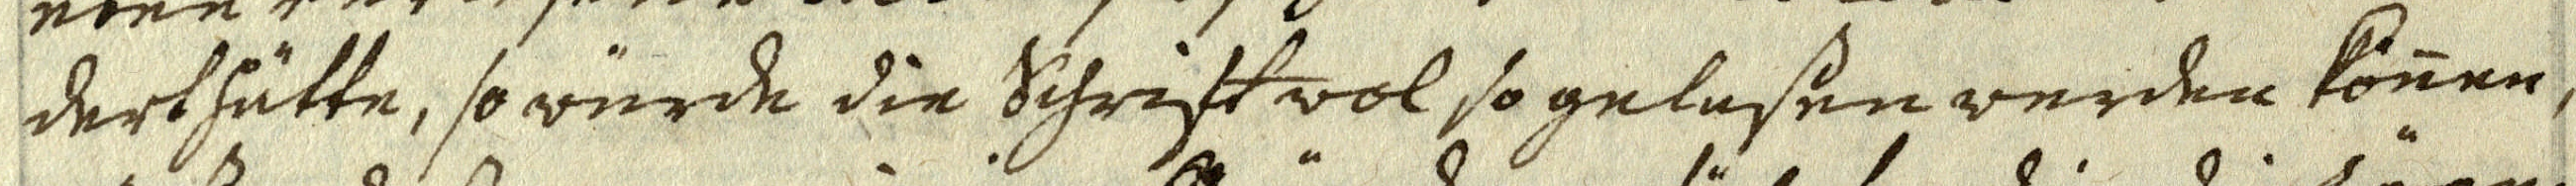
dert hätte, so würde die Schrift wohl so gelesen werden könen,
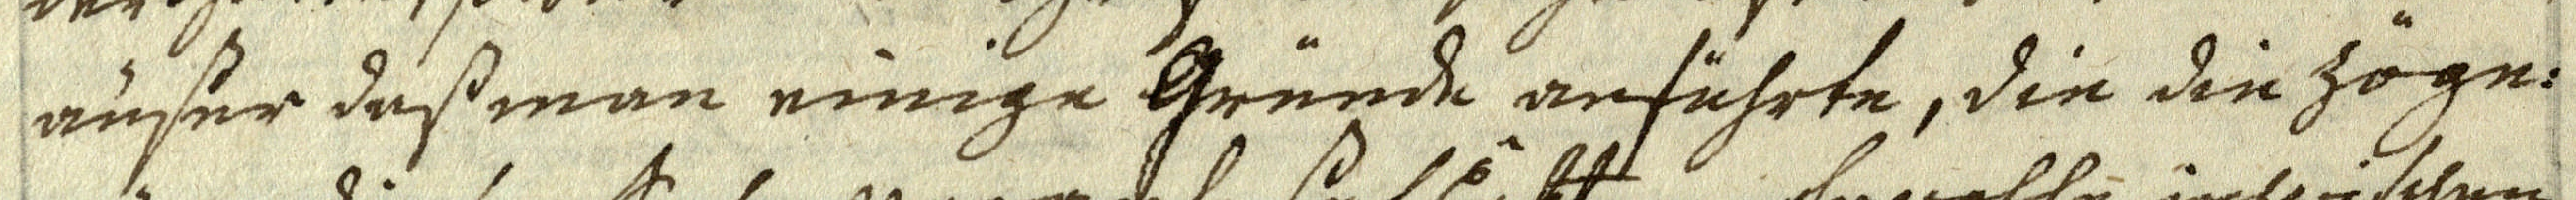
außer daß man einige Gründe anführte, die die Zöge¬
